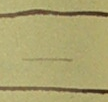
-
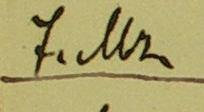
7. Mr.
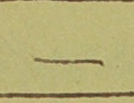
-
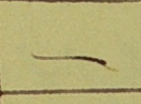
-
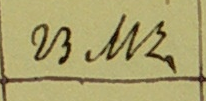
23. Mr.
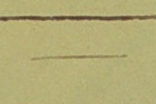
-
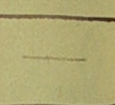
-
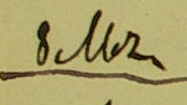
8. Mr.
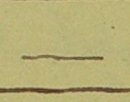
-
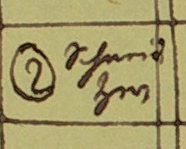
2 Schm.
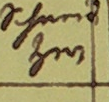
Z.
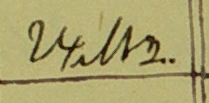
24. Mr .
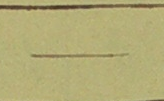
-
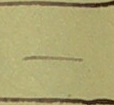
-
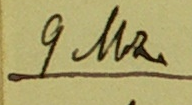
9. Mr.
